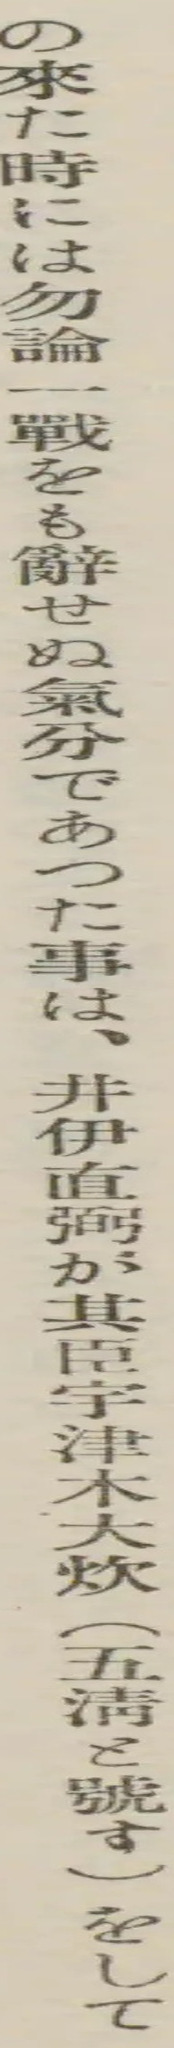の来た時には勿論一戦をも辞せぬ気分ではあつた事は、井伊直弼が、其臣宇津木大炊(五清と号す)をして
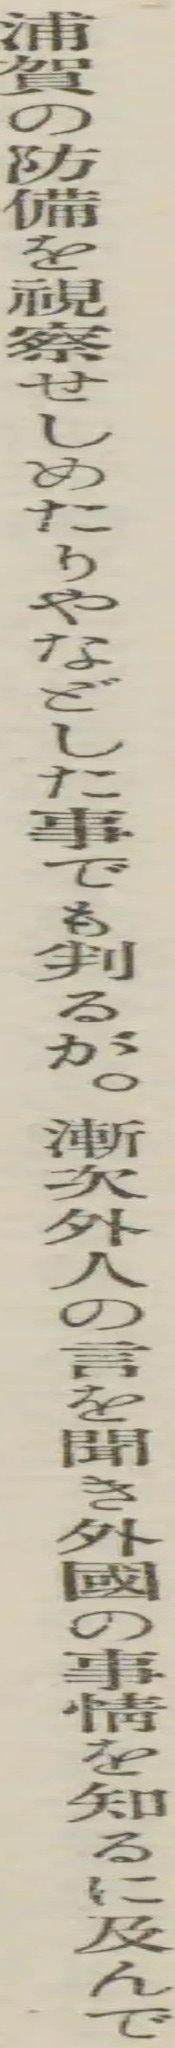浦賀の防備を視察せしめたりやなどした事でも判るが。漸次外人の言を聞き外国の事情を知るに及んで
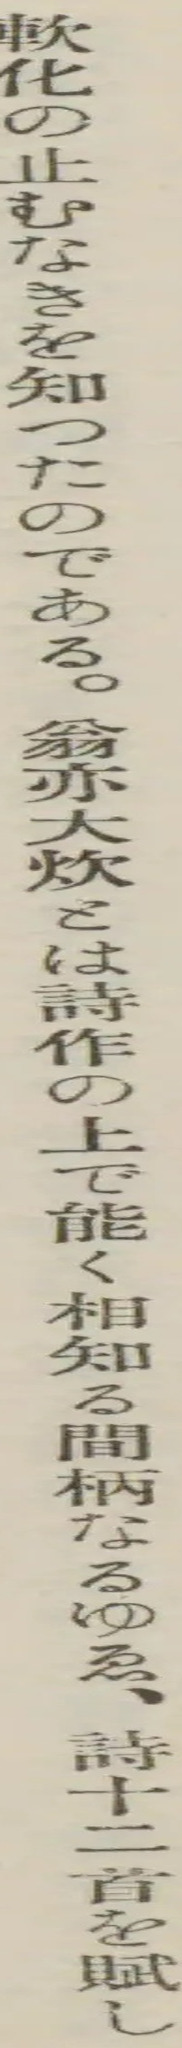軟化の止むなきを知つたのである。翁亦大炊とは詩作の上で能く相知る間柄なるゆゑ、詩十二首を賦し
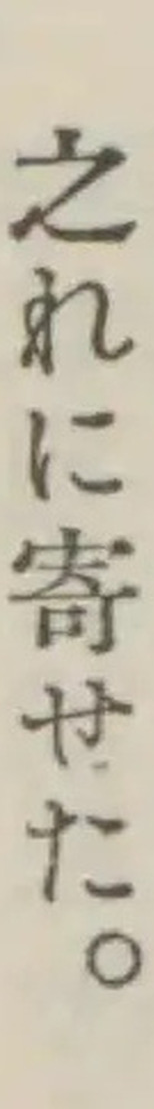之れに寄せた。
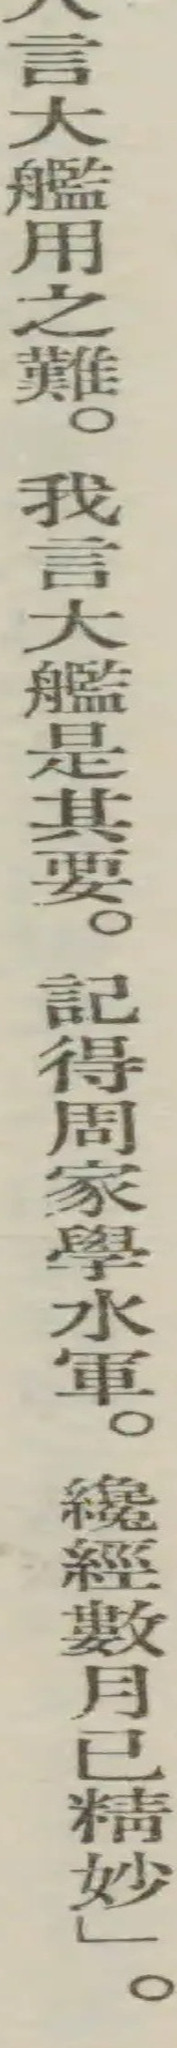人言大艦用之難。我言大艦是其要。記得周家学水軍。纔経数月已精妙」。
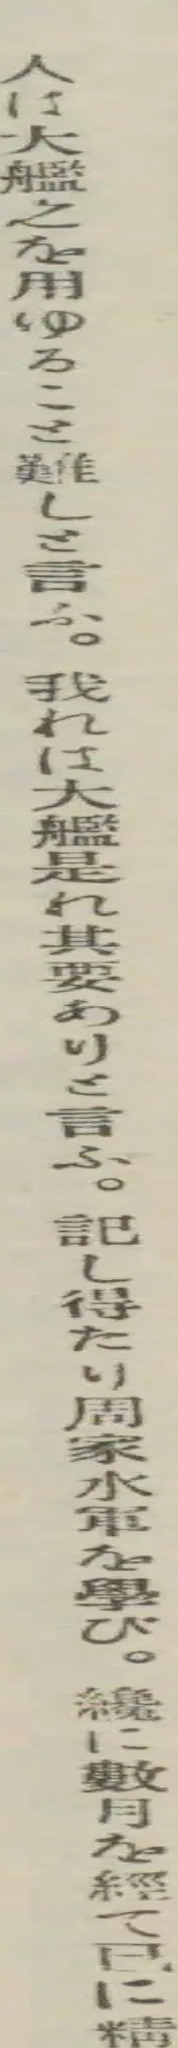人は大艦之を用ゆること難しと言ふ。我れは大艦是れ其要ありと言ふ。記し得たり周家水軍を学び。纔に数月を経て已に精妙なりしを。
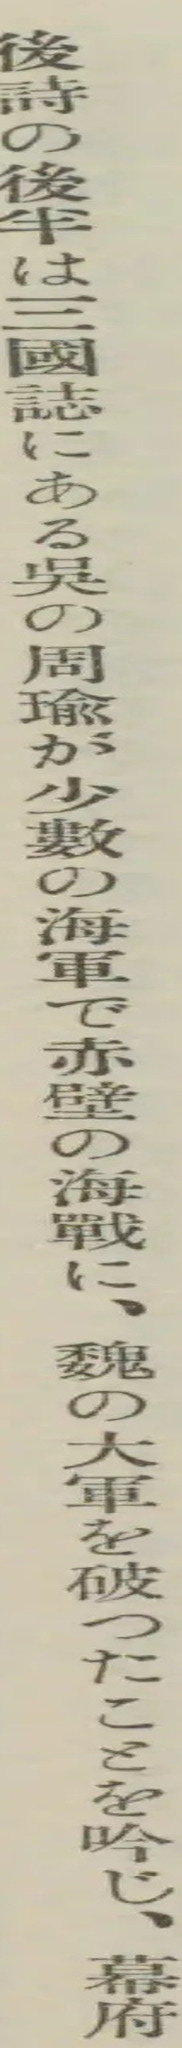後詩の後半は三国誌にある呉の周瑜が少数の海軍で赤壁の海戦に、魏の大軍を破つたことを吟じ、幕府
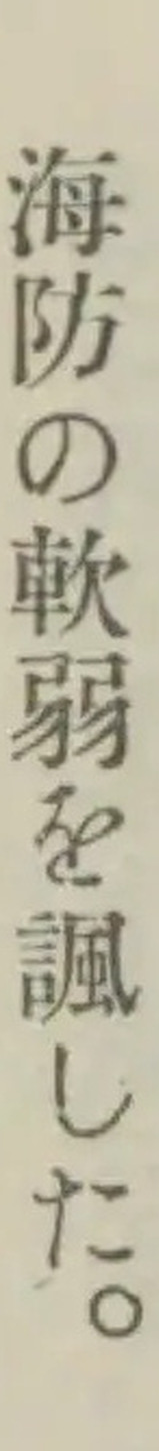海防の軟弱を諷した。
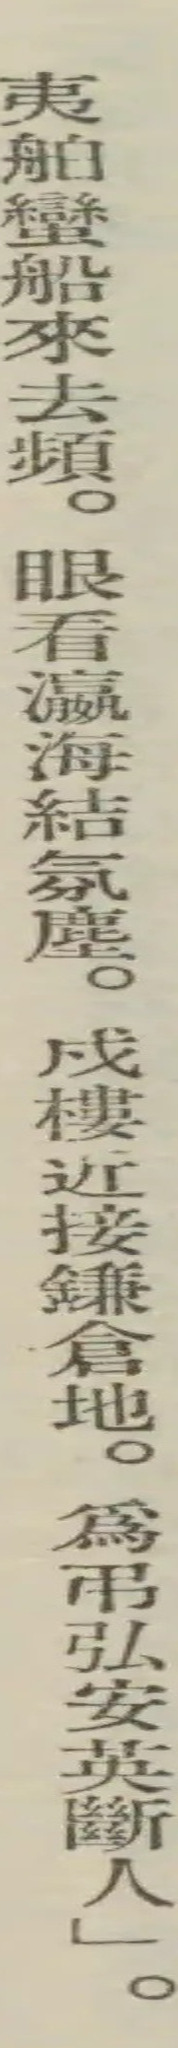夷舶蛮船来去頻。眼看瀛海結氛塵。戌楼近接鎌倉地。為弔弘安英断人」。
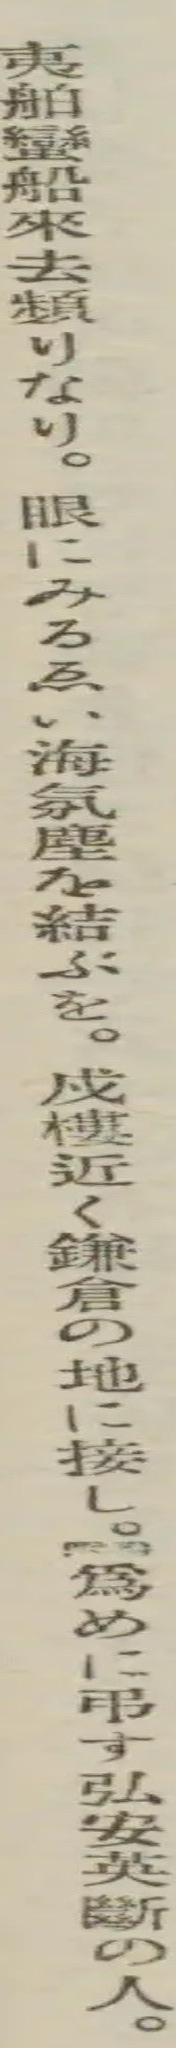夷舶蛮船来去頻りなり。眼にみるゑい海氛塵を結ぶを。戌楼近く鎌倉の地に接し。為めに弔す弘安英断の人。
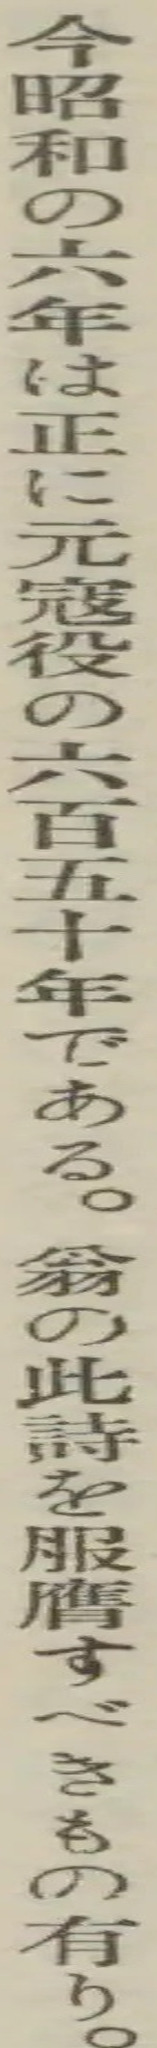今昭和の六年は正に元寇役の六百五十年である。翁の此詩を服膺すべきもの有り。
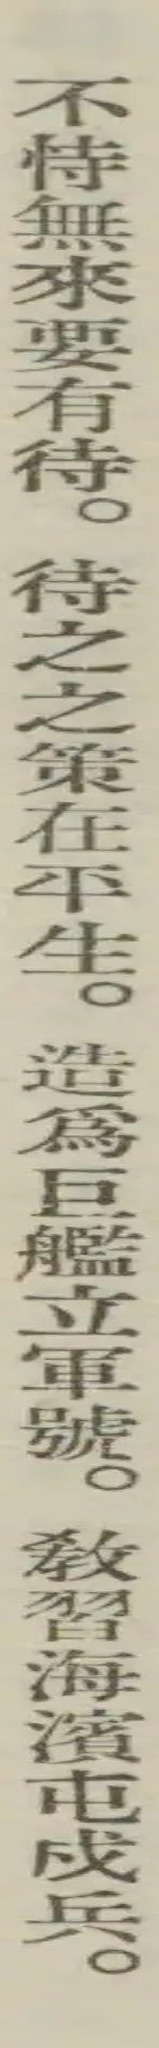不恃無来要有待。待之之策在平生。造為巨艦立軍號。教習海濱屯戌兵。
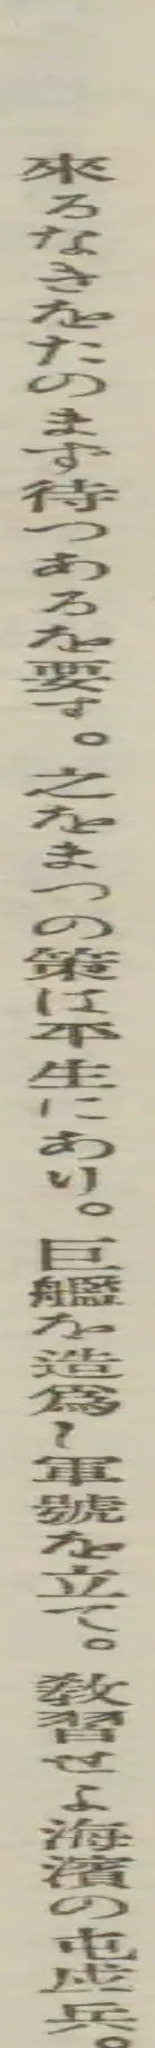来るなきをたのまず待つあるを要す。之をまつの策は平生にあり。巨艦を造為し軍号を立て。教習せよ海浜の屯戌兵。
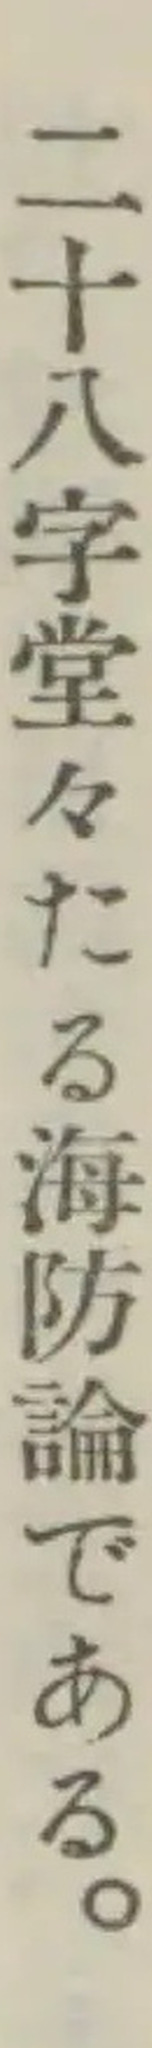二十八字堂々たる海防論である。
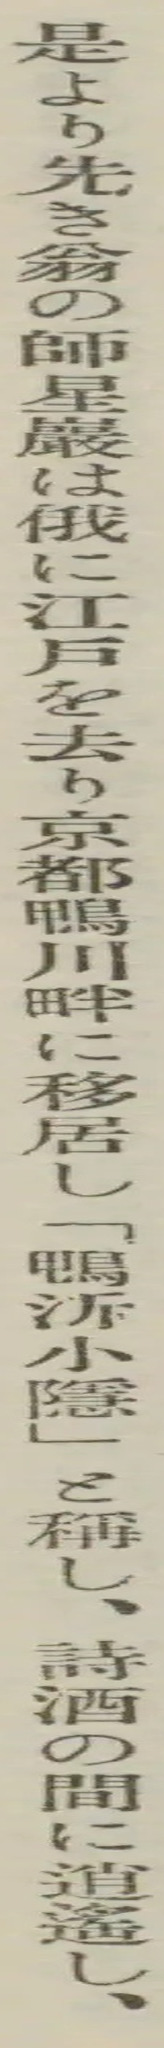是より先き翁の師星巌は俄に江戸を去り京都鴨川畔に移居し「鴨泝小隠」と称し、詩酒の間に逍遥し、
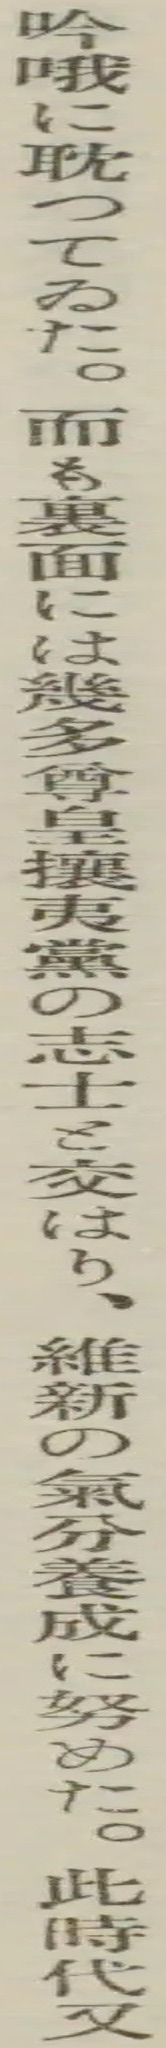吟哦に耽つてゐた。而も裏面には幾多尊王攘夷党の志士と交はり、維新の気分養成に努めた。此時代又
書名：小野湖山翁小伝
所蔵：国立国会図書館 National Diet Library, JAPAN
